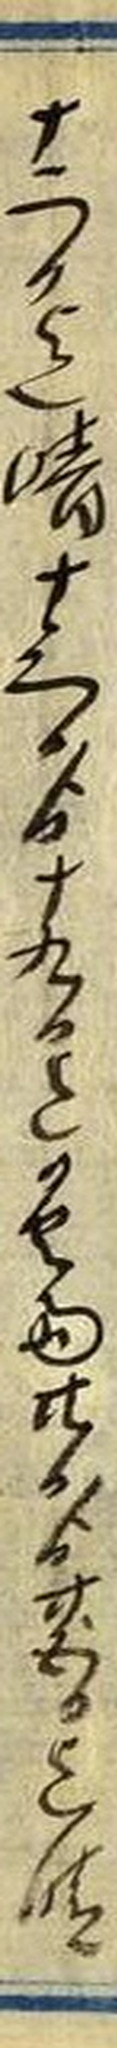十二日迄晴十三日ゟ十九日迄曇雨廿日ゟ廿五日迄晴
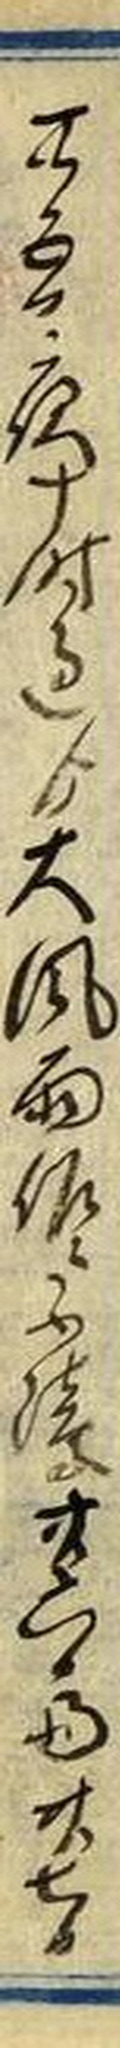廿五日夜十時過ゟ大風雨様に不凌廿六日雨廿七日
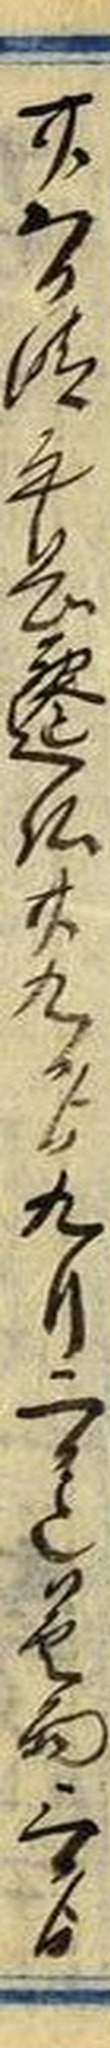廿八日晴平岡遷仏廿九日ゟ九月二日迄曇雨三日ゟ
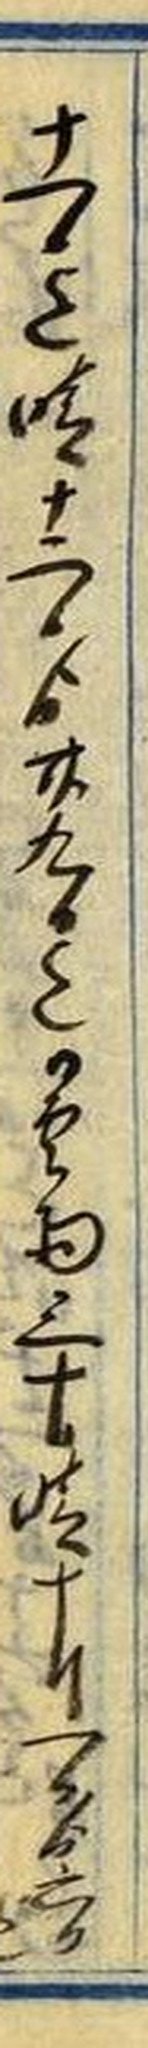十一日迄晴十二日ゟ廿九日迄曇雨三十日晴十月一日ゟ六日迄

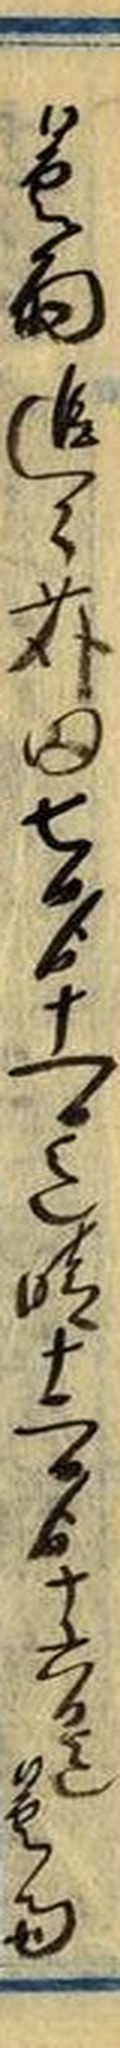曇雨追々苅田七日ゟ十一日迄晴十二日ゟ十六日迄曇雨
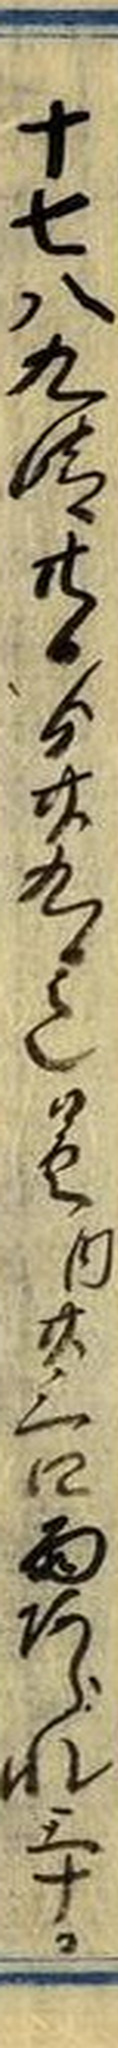十七八九晴廿日ゟ廿九日迄曇内廿三四雨あられ三十日
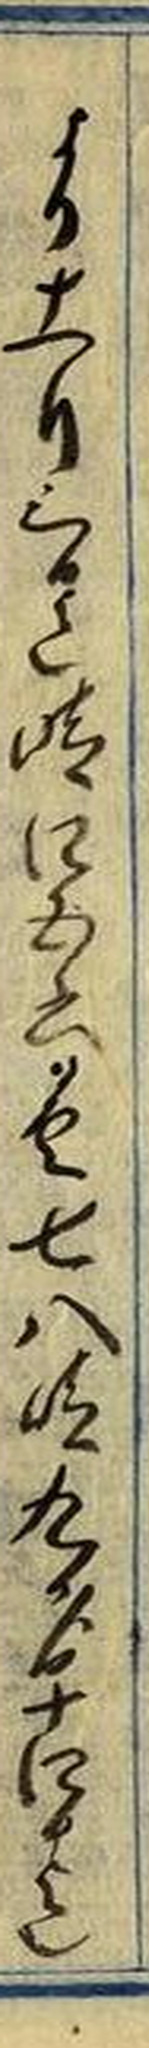より十一月三日迄晴四五六曇七八晴九日ゟ十四日迄
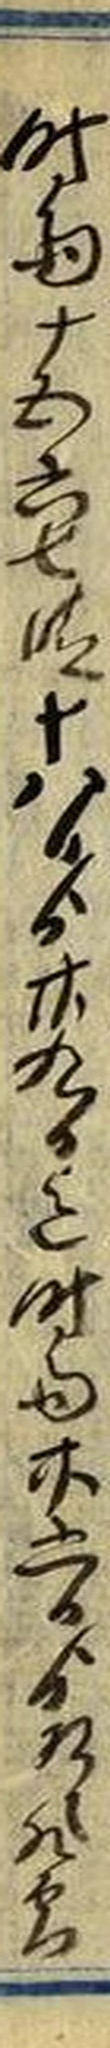時雨十五六七晴十八日ゟ廿九日迄時雨廿六日ゟ折々水雪
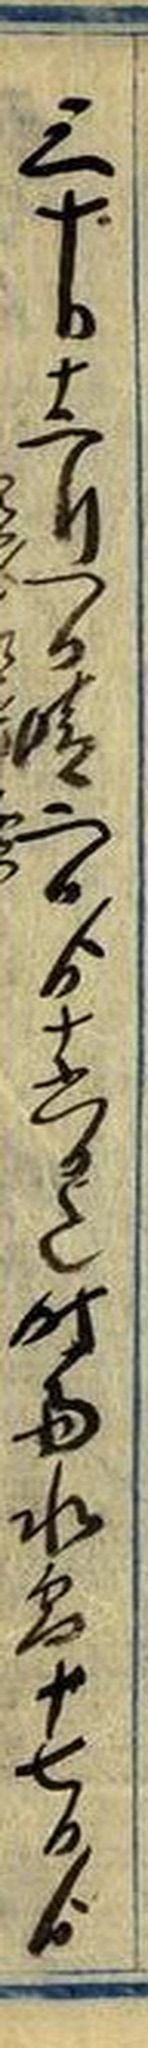三十日十二月一日晴二日ゟ十六日迄時雨水雪十七日ゟ
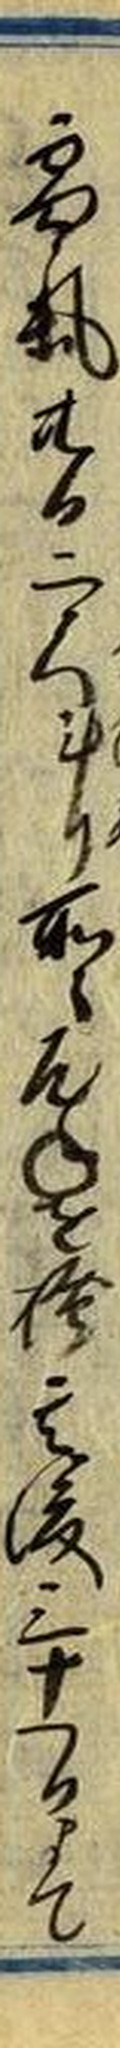雪気廿日二尺計り所々屋ねを捨其後三十一日にて
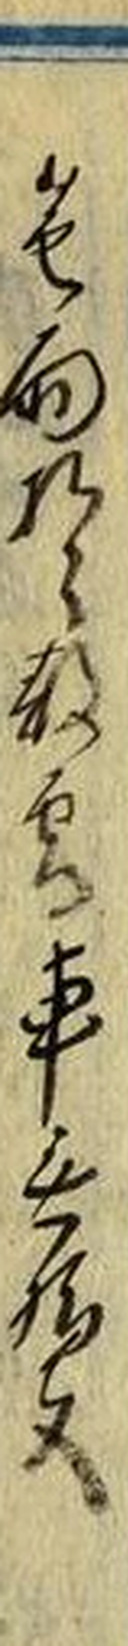曇雨折々散雪車無指支
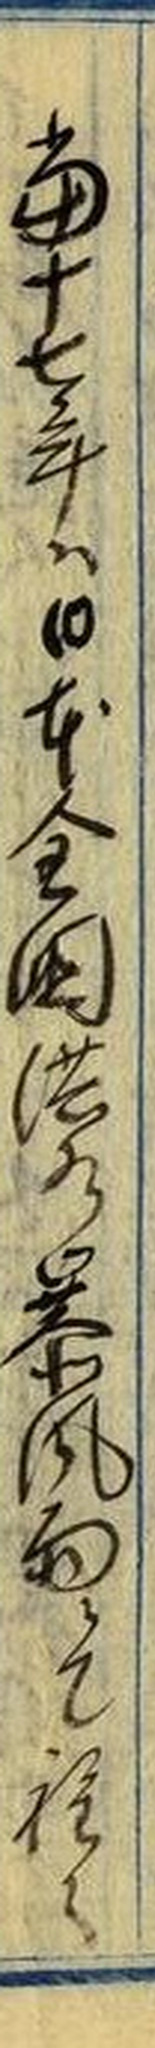当十七年は日本全国洪水暴風雨にて種々
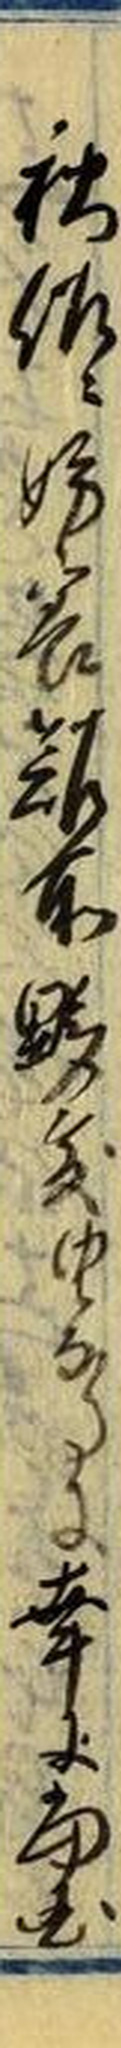秋作に妨害難所夥敷由なるに幸に当国
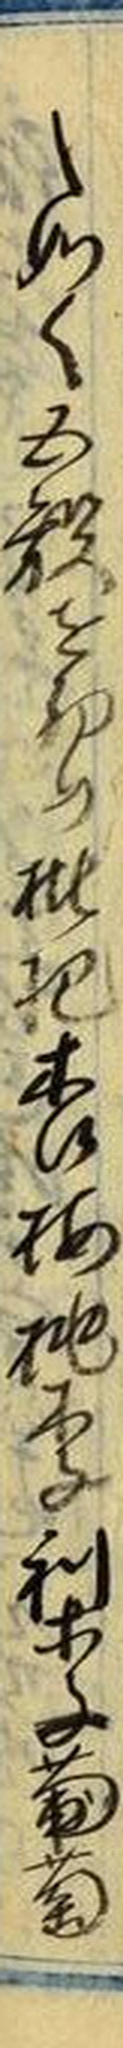之如く五穀を初め枇杷杏梅桃李梨子葡萄
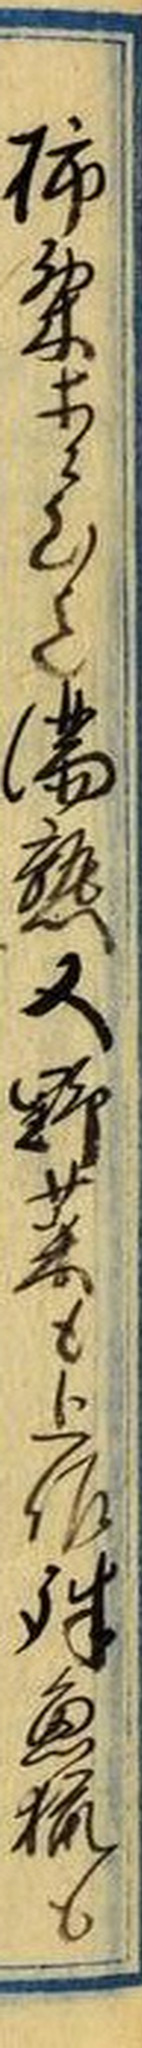柿栗等に至迄満熟又野菜も上作殊魚猟も
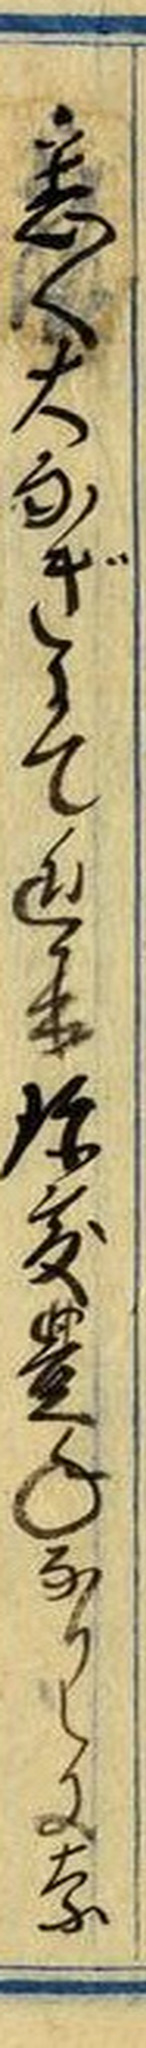悉く大なぎにて近来珍敷豊年なりしにな
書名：温古集 五巻
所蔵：福井県文書館 Fukui Prefectural Archives
